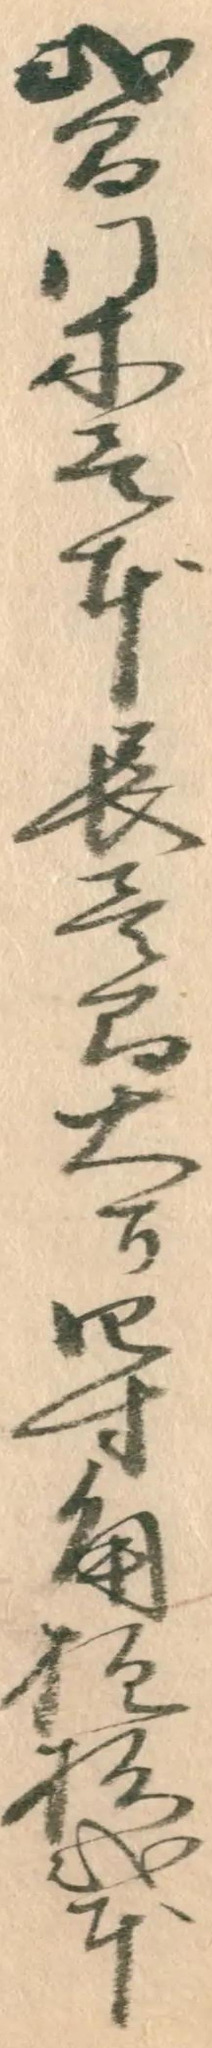弐間同木壱本長壱間大サ四寸角柱杉弐本
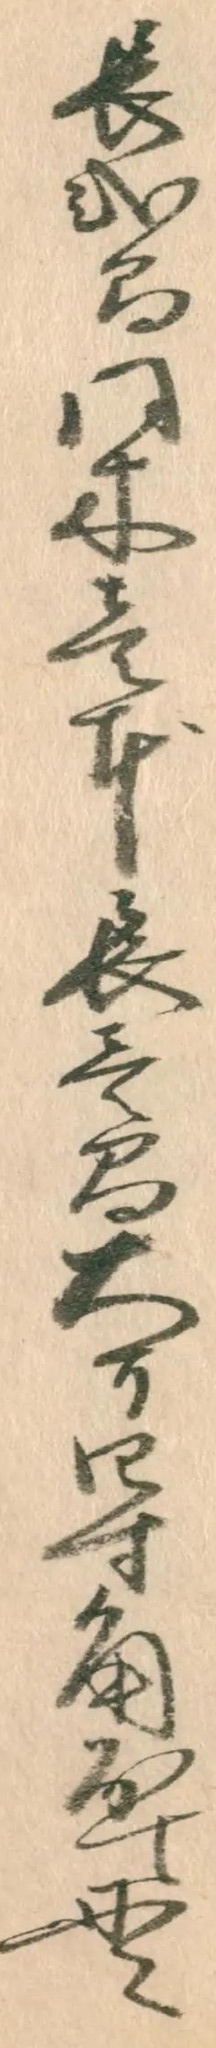長弐間同木壱本長壱間大サ四寸角通し貫
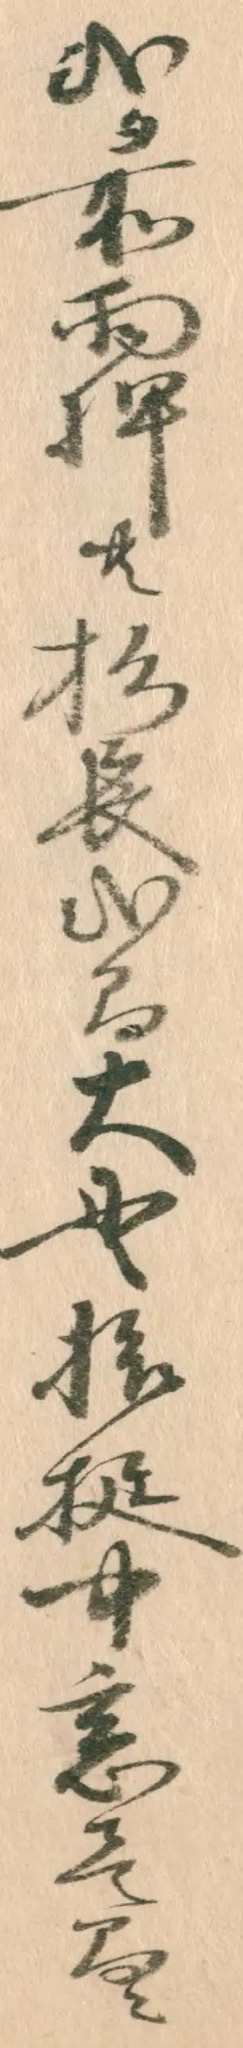弐タ所雨押共杉長弐間大貫拾挺中窓壱間ニ
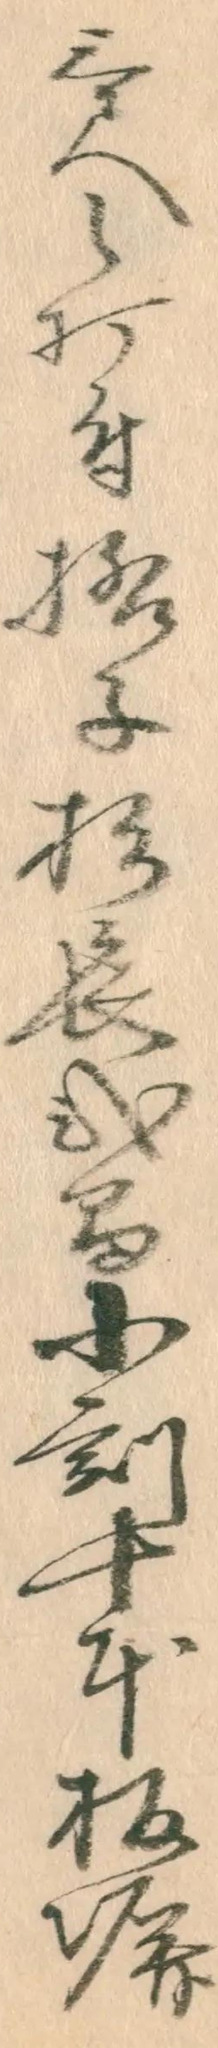三尺之打付格子杉長弐間小割十本板塀
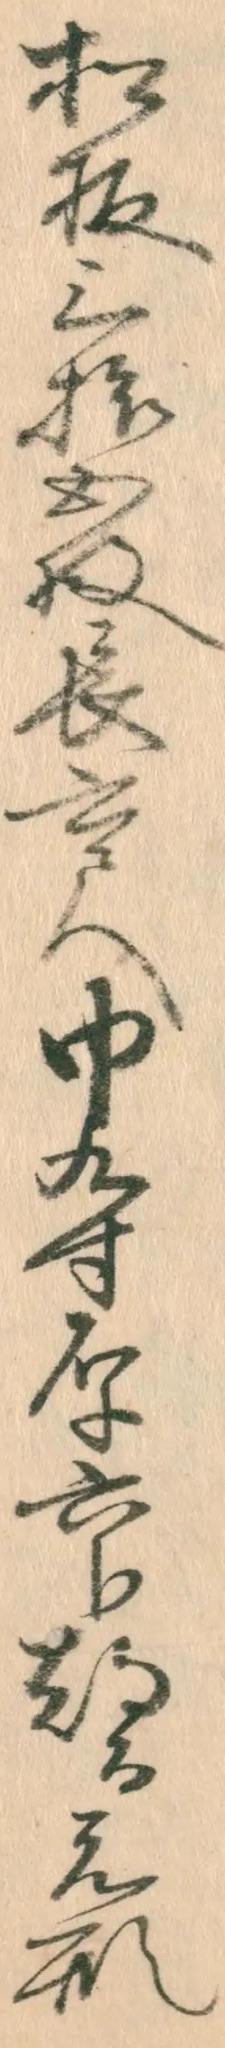松板三拾五枚長六尺巾九寸厚六分都而元形
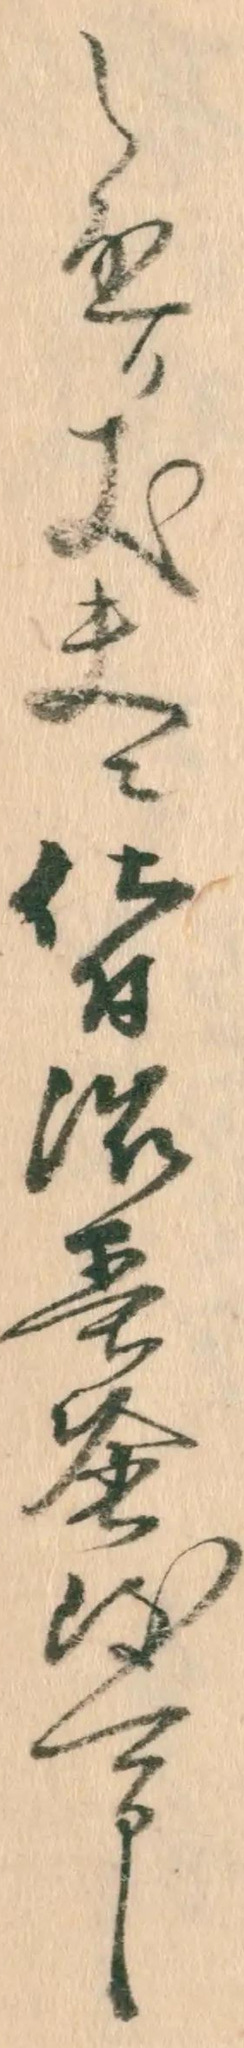之通り丈夫ニ仕付渋墨塗致可申
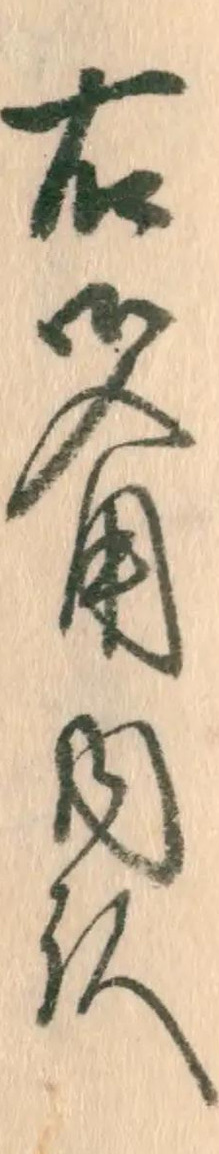右御入用内訳
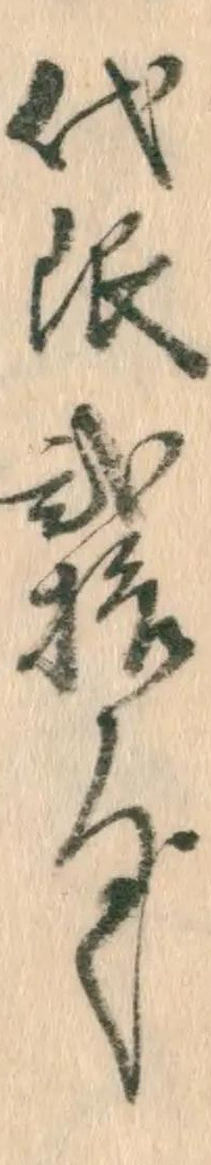代銀弐拾匁但壱本銀五匁
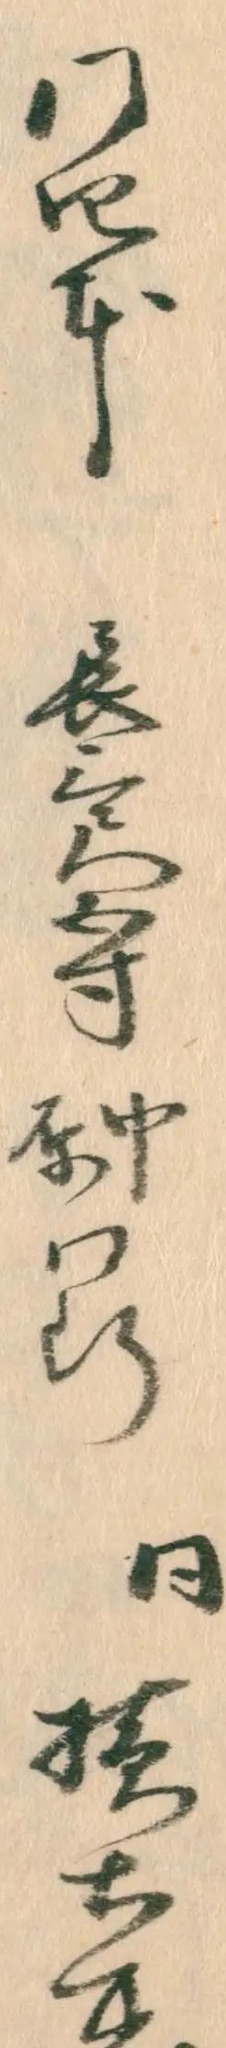一同四本長三尺五寸巾厚同断同横土台

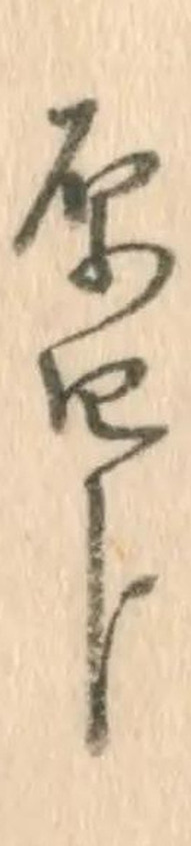厚四分
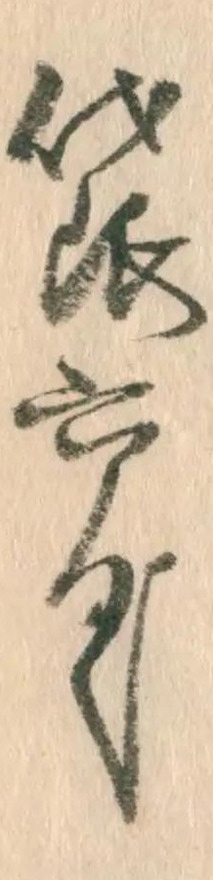代銀六匁但壱枚銀六分
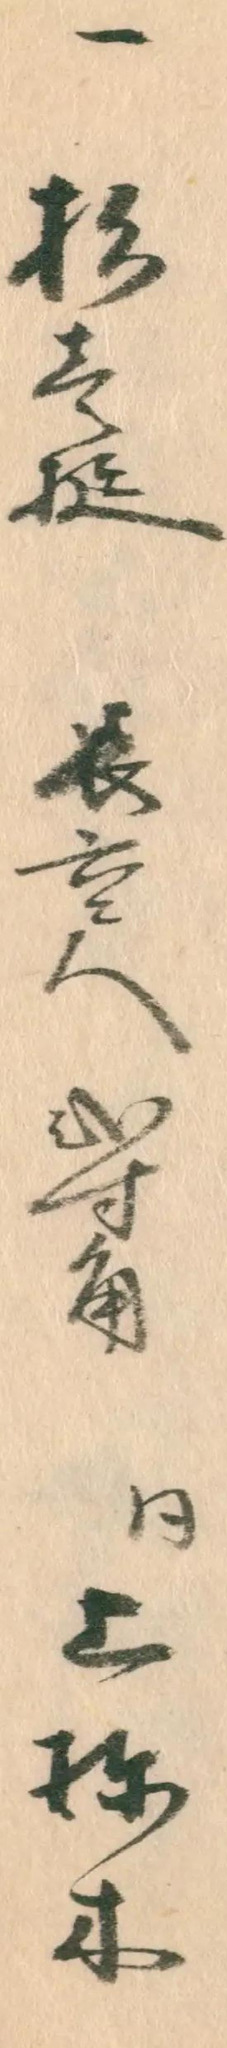一杉壱挺長六尺弐寸角同上棟木
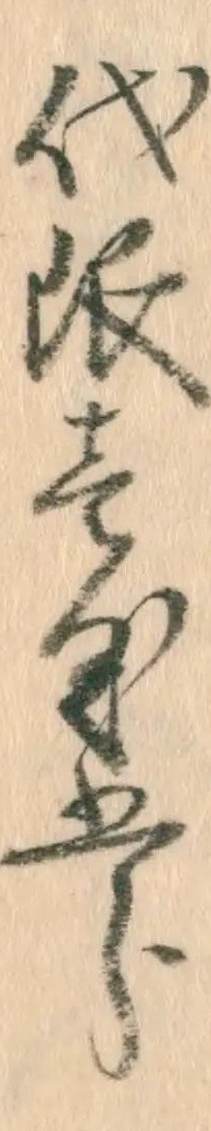代銀壱匁五分
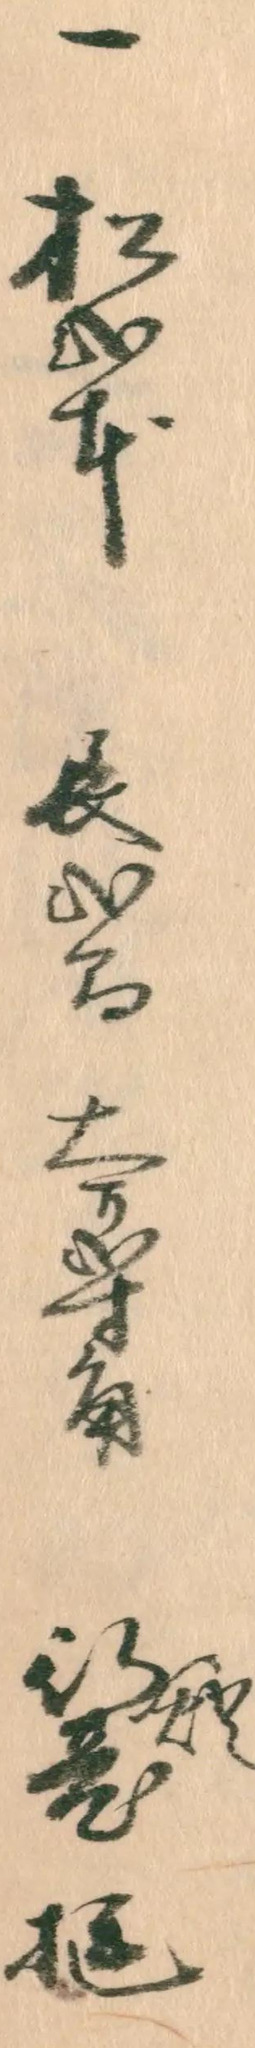一松弐本長弐間大サ弐寸角行灯台框
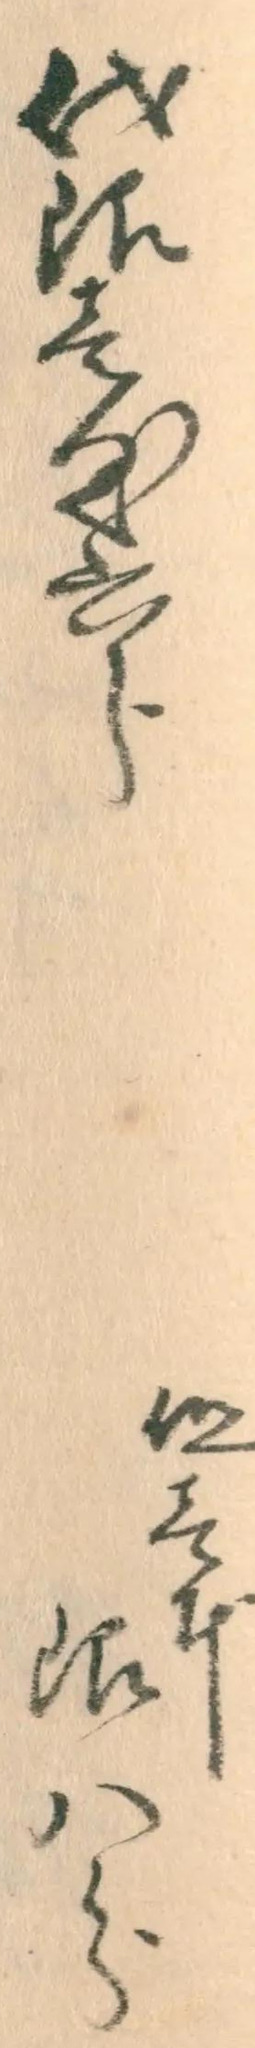代銀壱匁六分但壱本銀八分
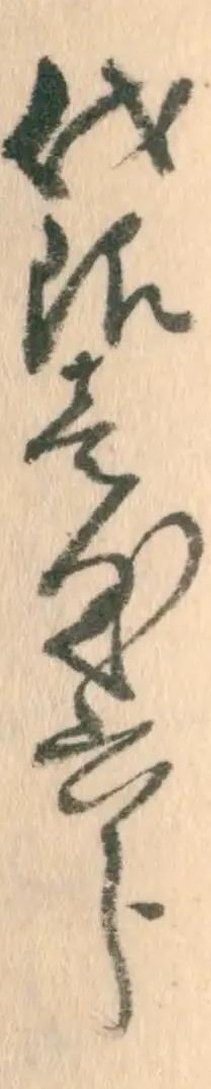代銀壱匁五分
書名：三橋 17巻. [7] 三橋小破御修復書留　但御奉行御掛リ替地震潰橋番屋　嘉永四亥年より安政二卯年迄　上
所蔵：国立国会図書館 National Diet Library, JAPAN
